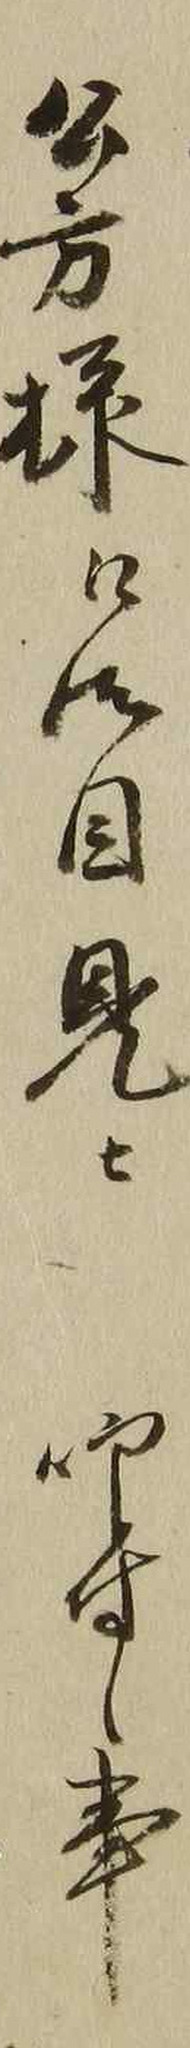公方様江御目見被仰付候事
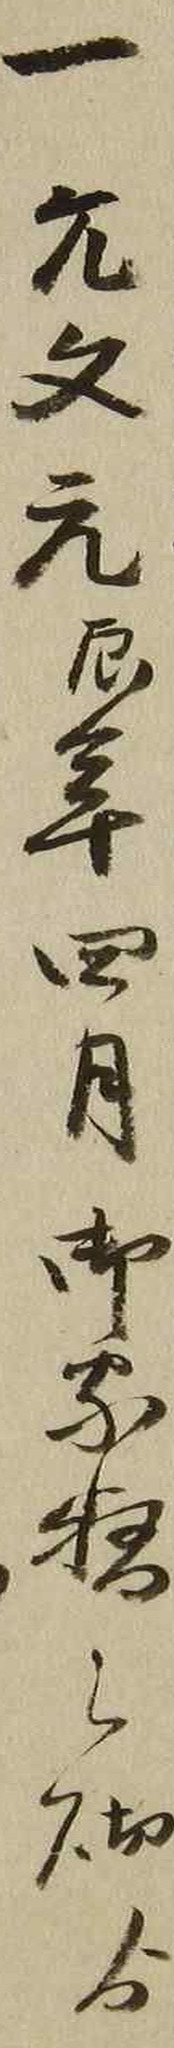一元文元辰年四月御家督之砌ゟ
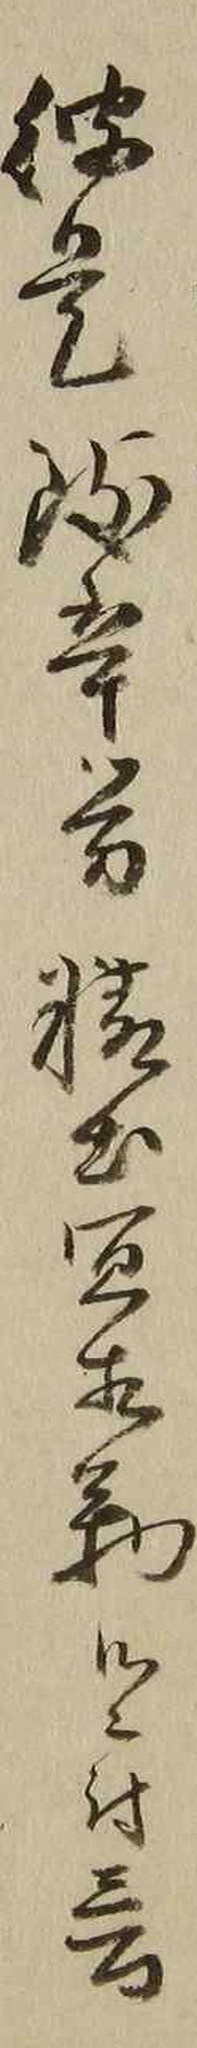彼是致辛労精出宜相勤候に付三百
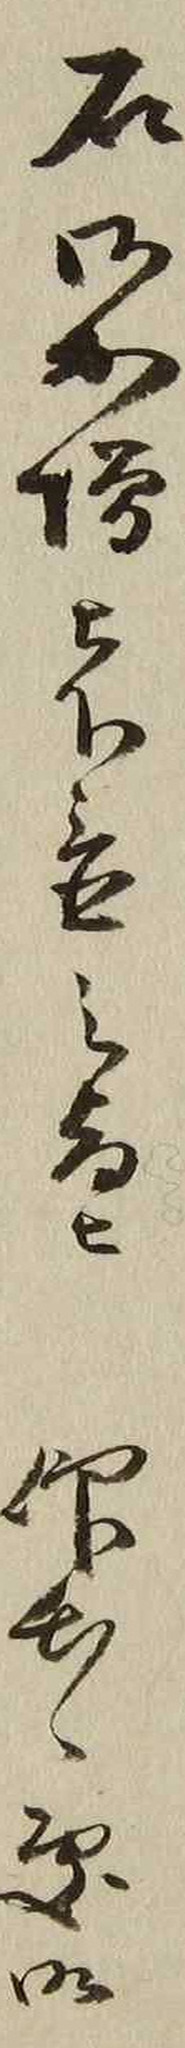石御加増被下置之旨被仰出候処御
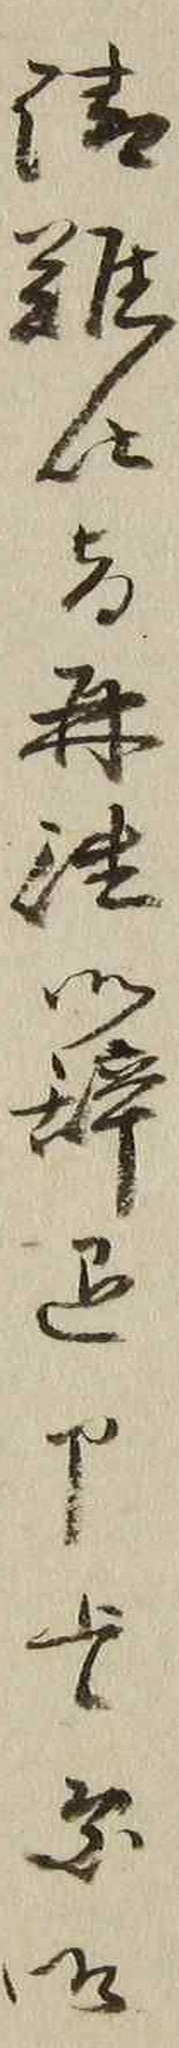請難仕旨井蛙御辞退申上候処御
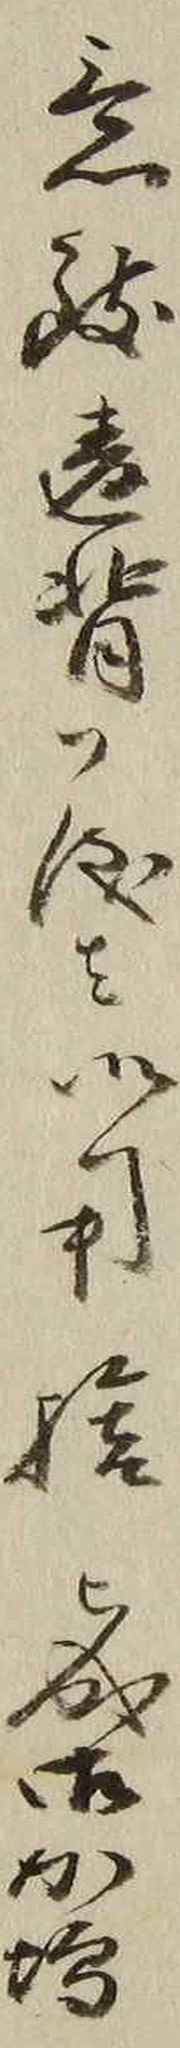意致違背候儀は御用捨被成御加増
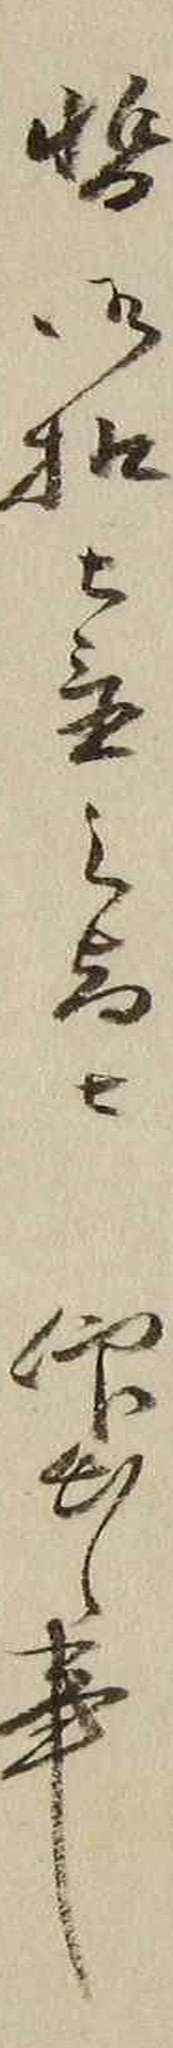暫御扣被置之旨被仰出候事
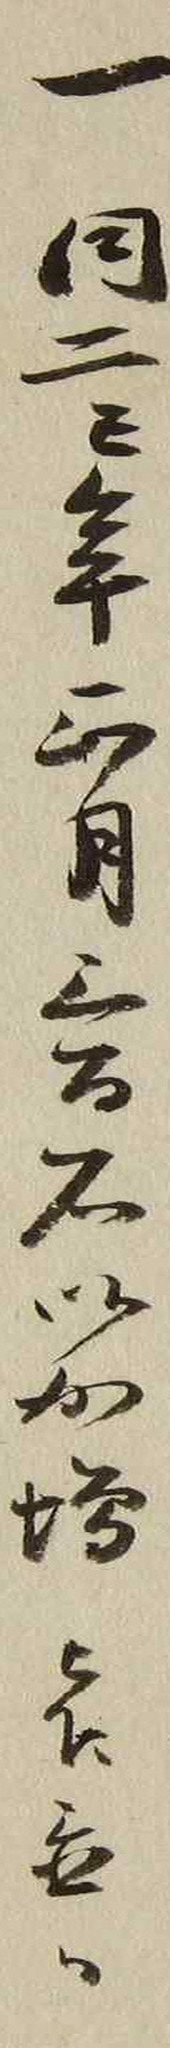一同二巳年正月三百石御加増被下置候事
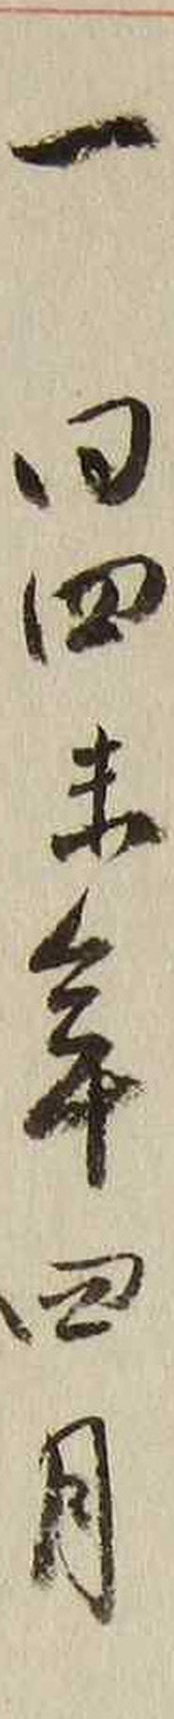一同四未年四月
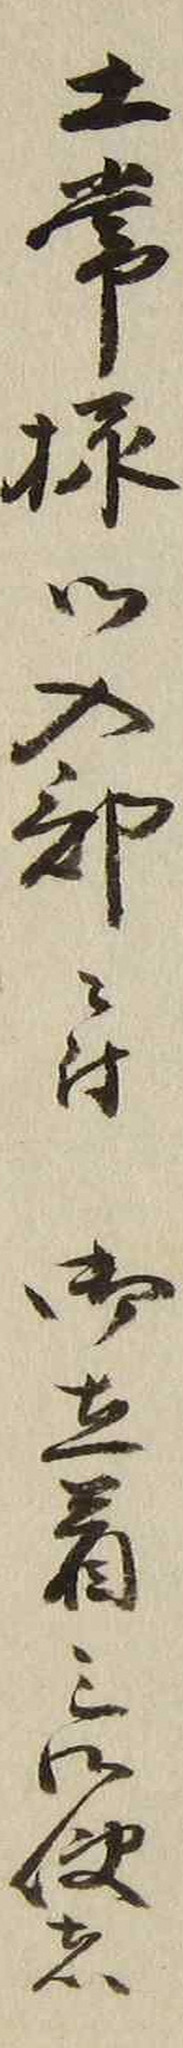土常御入部に付御在着之御使者
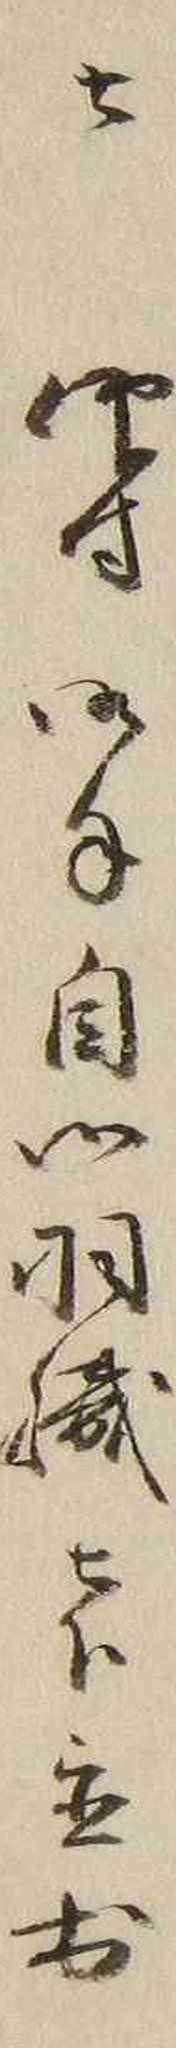被仰付御手自御羽織被下置於
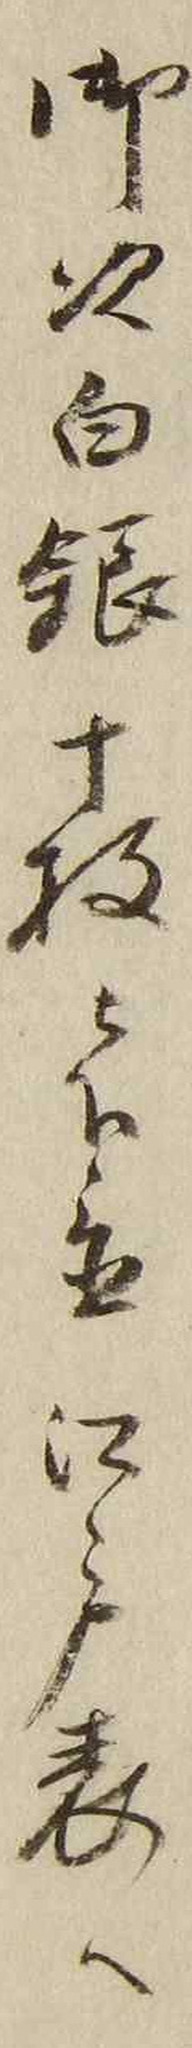御次白銀十枚被下置江戸表へ

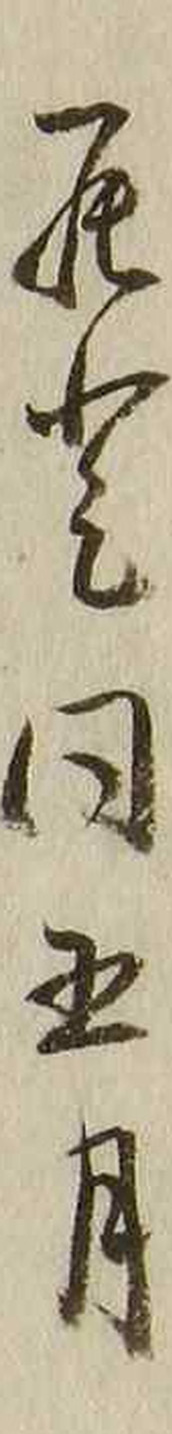罷登同五月
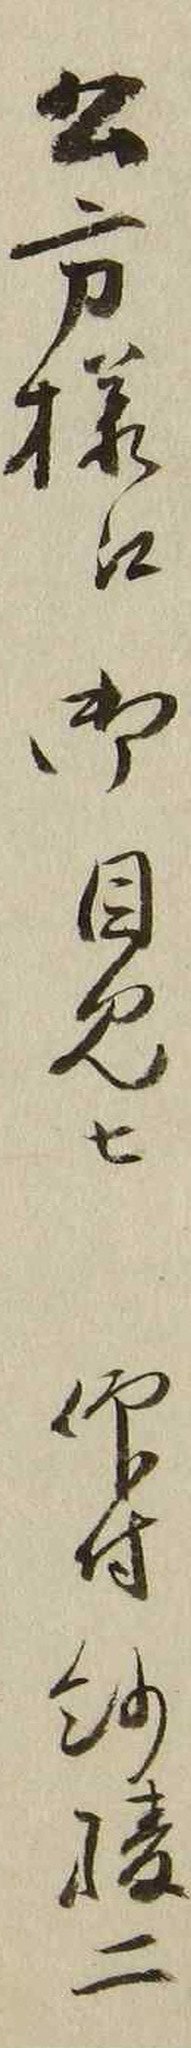公方様江御目見被仰付紗綾二
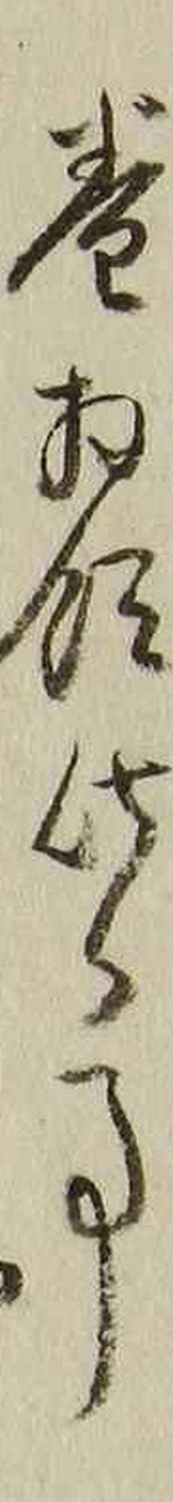巻拝領仕候事
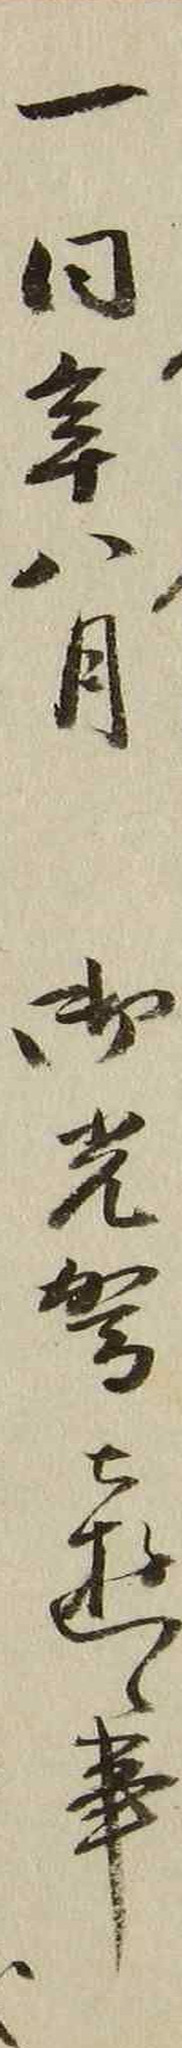一同年八月御光駕被遊候事
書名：諸士系譜　巻之269　さ之部1
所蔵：会津若松市立会津図書館
